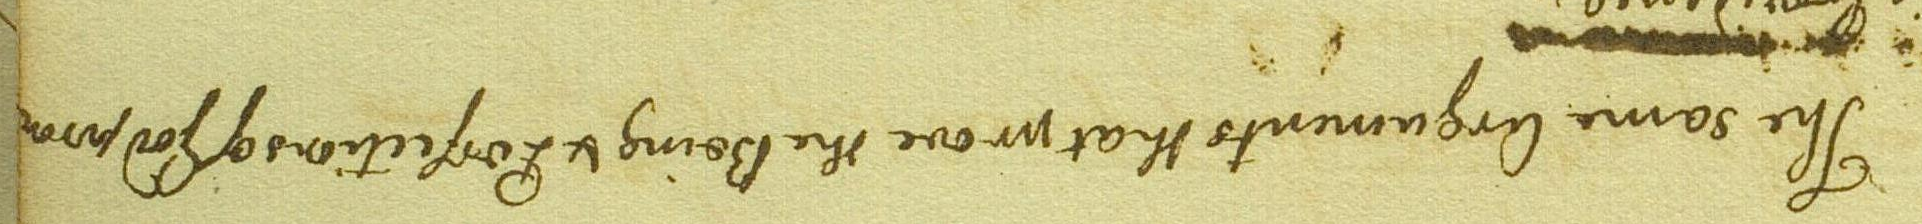The same Arguments that prove the Being & Perfections of God prove
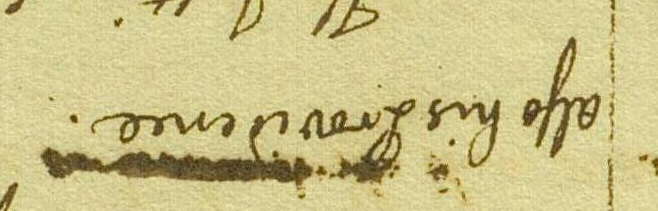also his Providence.
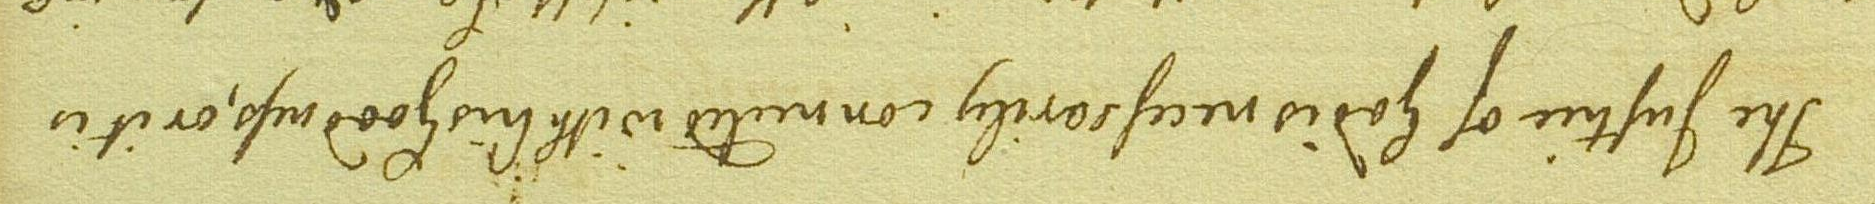The Justice of God is necessarily connected with his Goodness, or it is
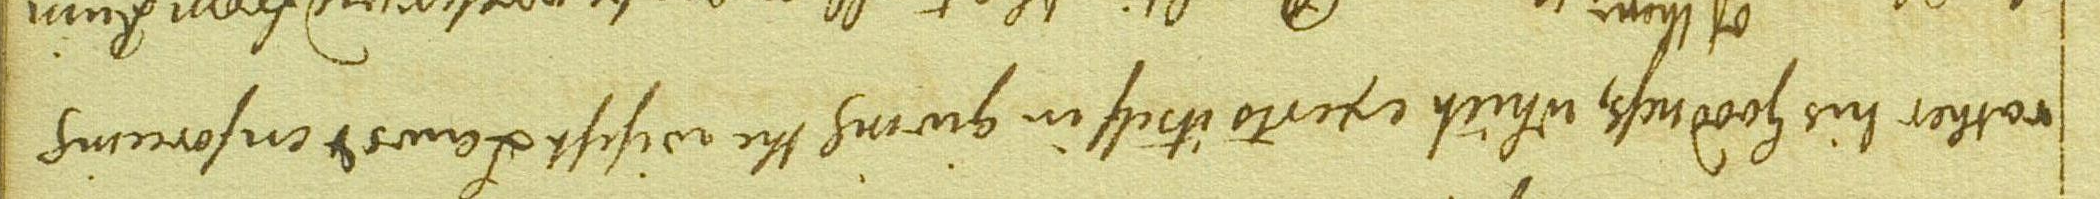rather his Goodness, which exerts itself in giving the wisest Laws & enforcing
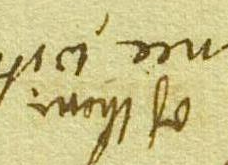of them
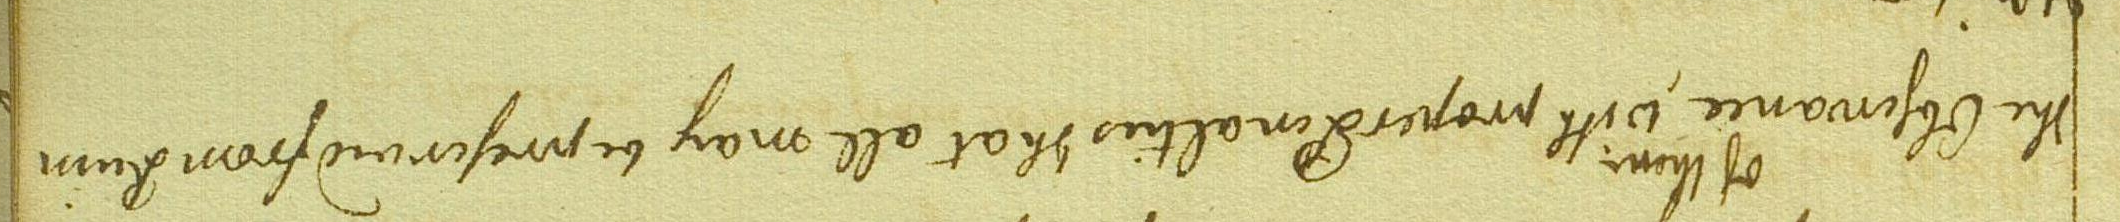the Observance, ^ with proper Penalties that all may be preserved from Ruin
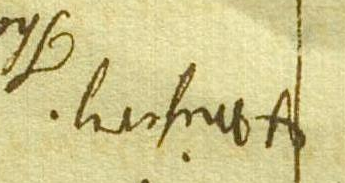& misery.
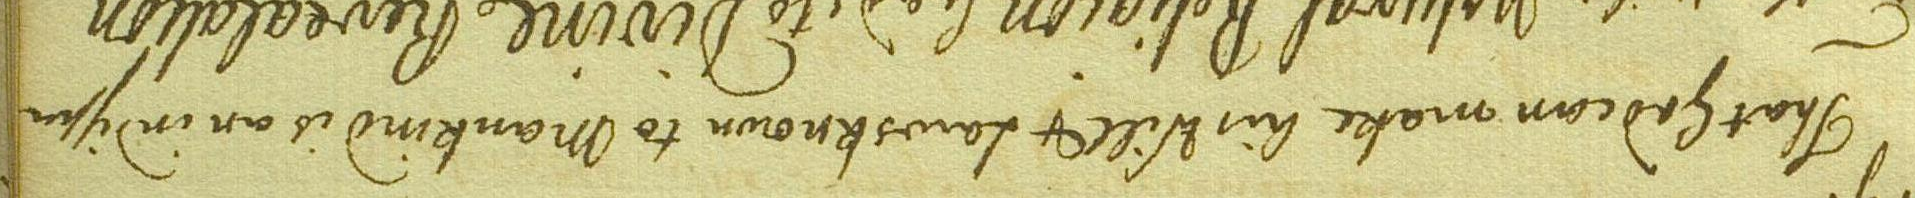That God can make his Will & Laws known to Mankind is an indissen-
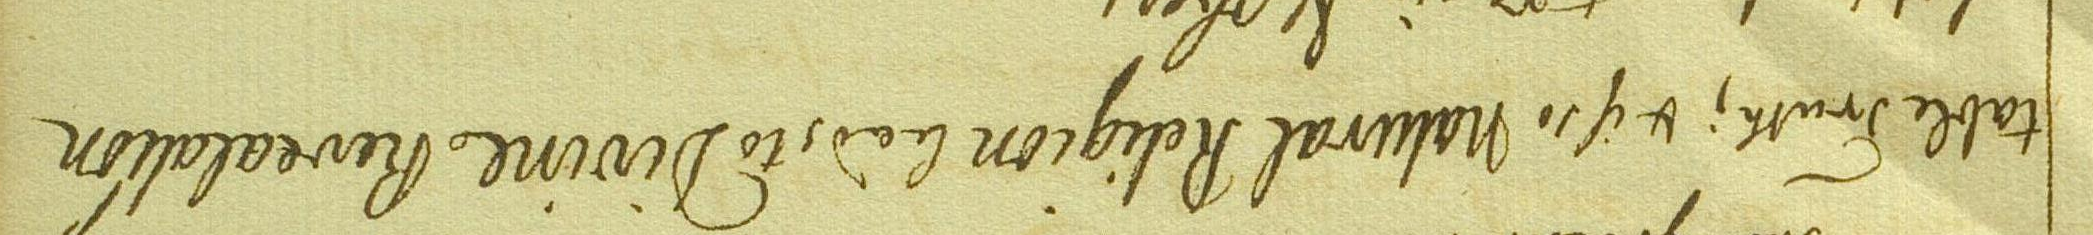-table Truth; & if so natural Religion leads to Divine Revealation
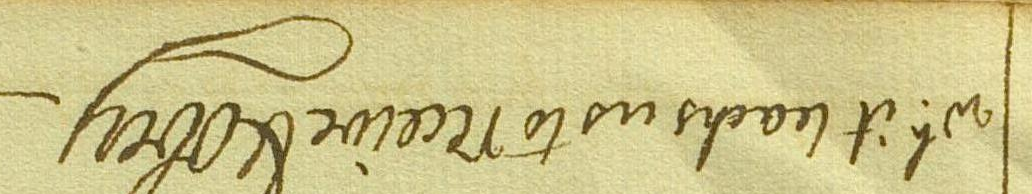w^h. it leads us to receive & Obey-
